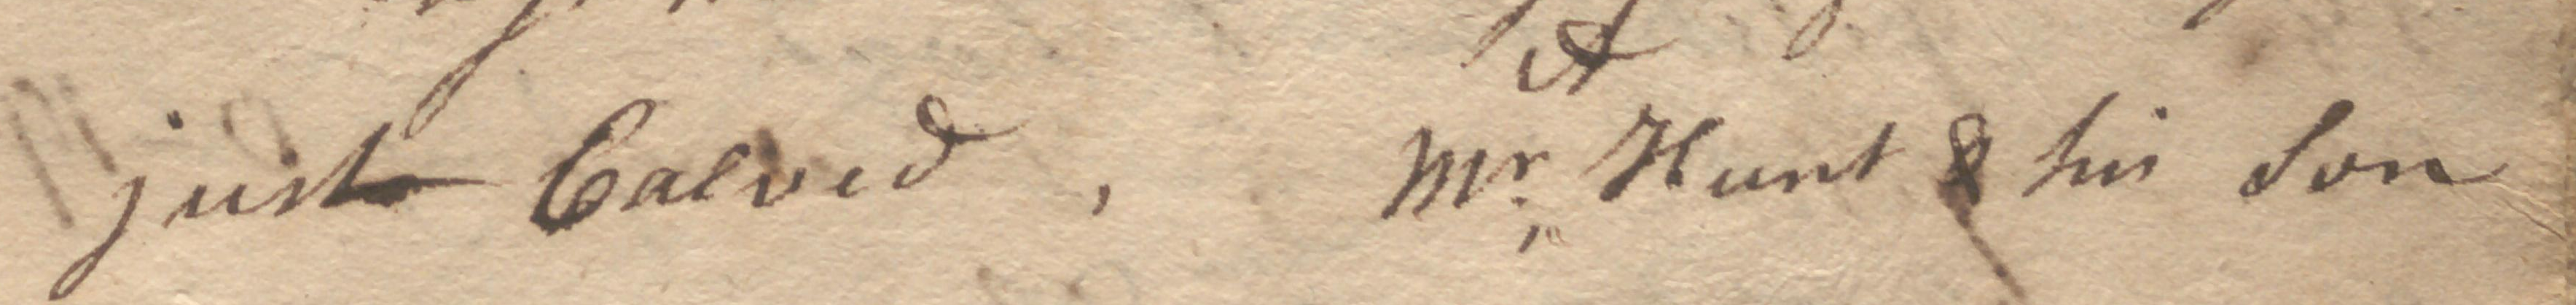guster Calved. M^r. Hunt & his Son
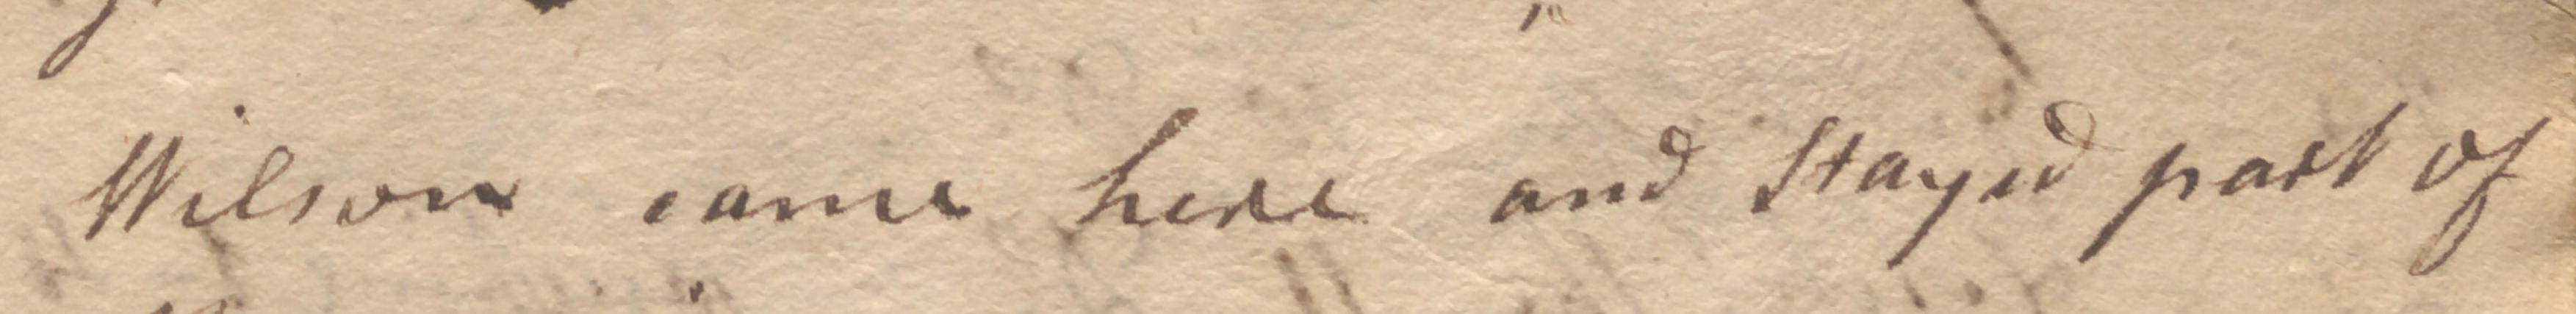Wilson came here and stayed part of
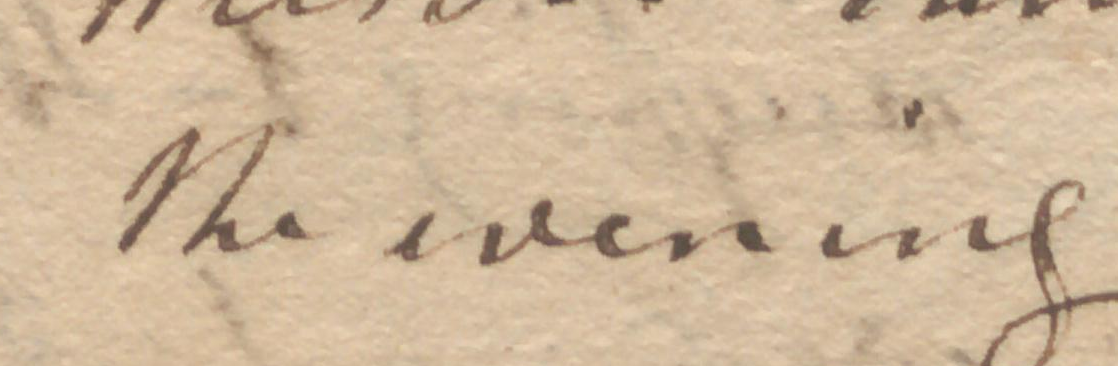the evening
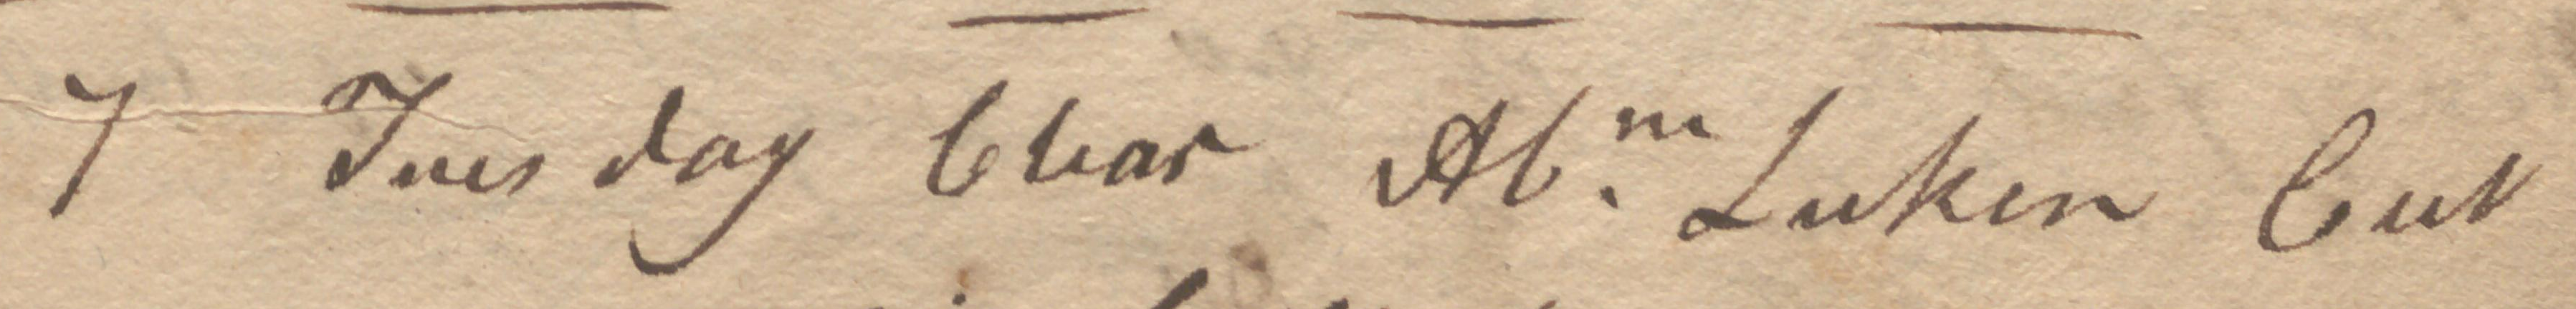7 Tuesday Clear Ab^m. Luken Cut
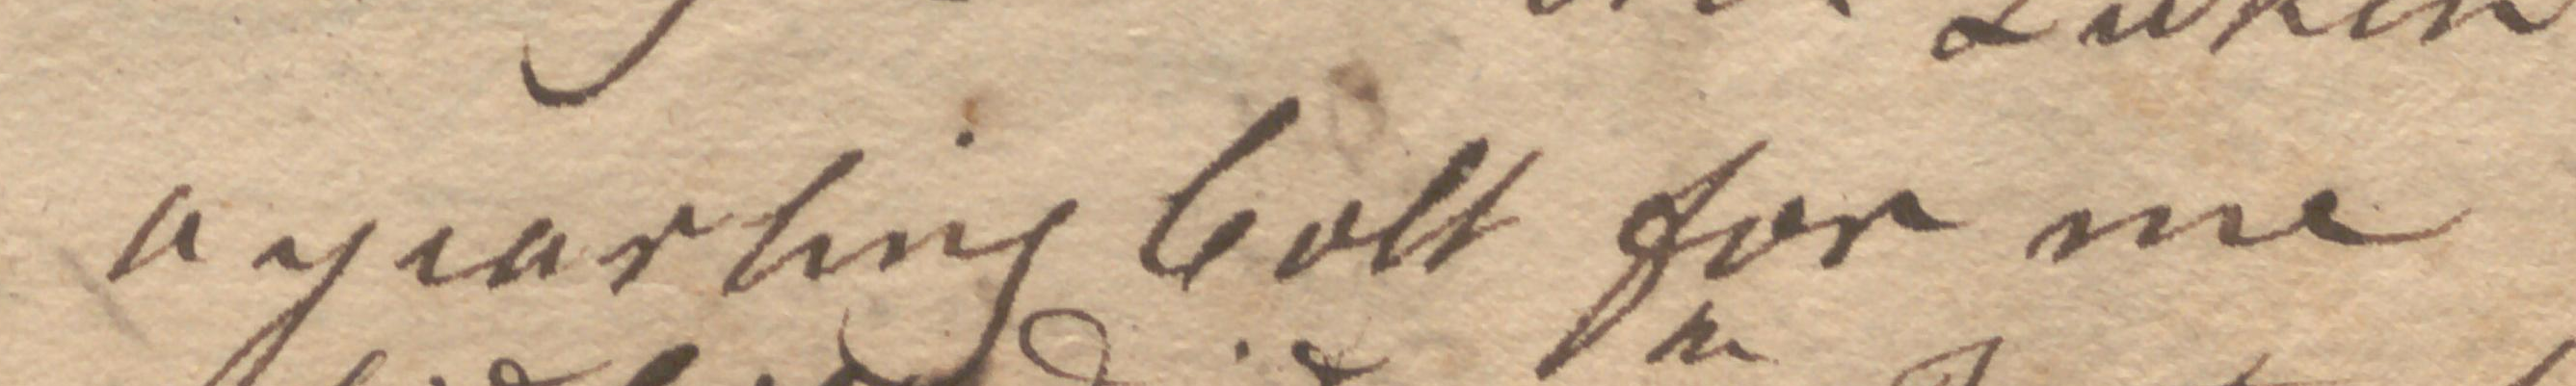a yearling Colt for me
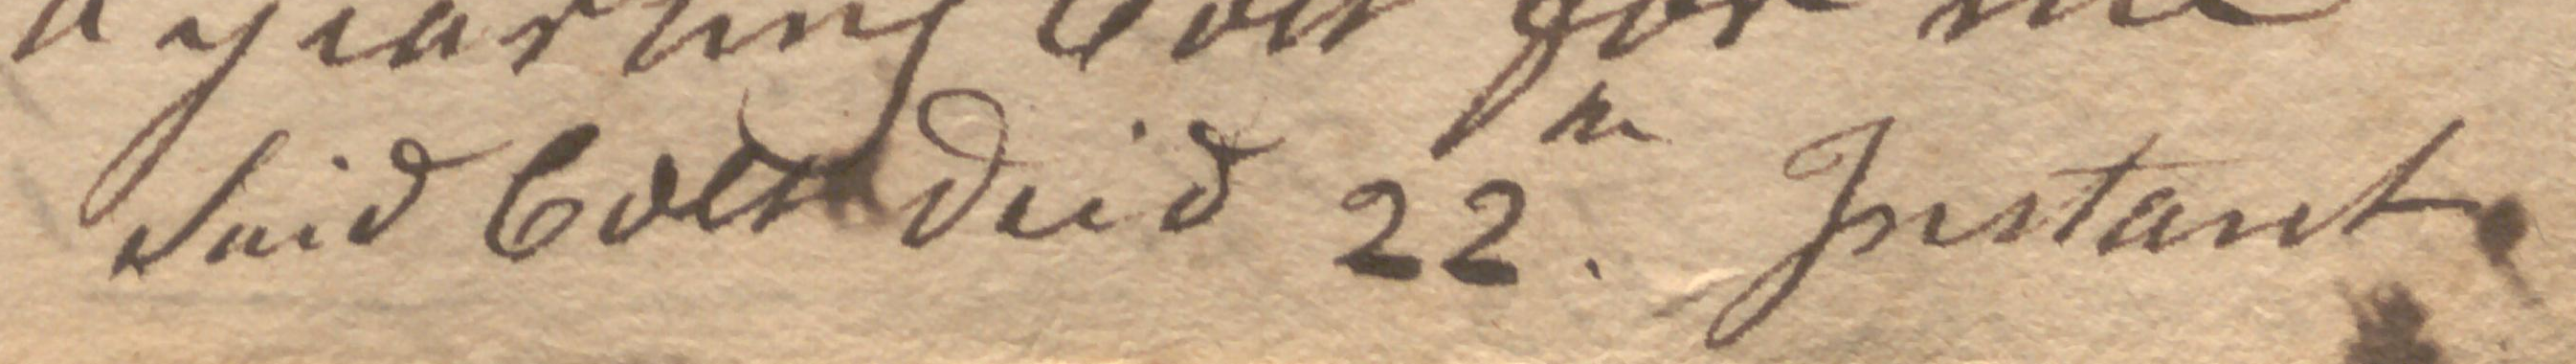said Colt died 22^th Instant
